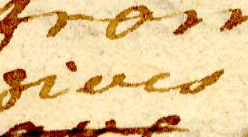gives
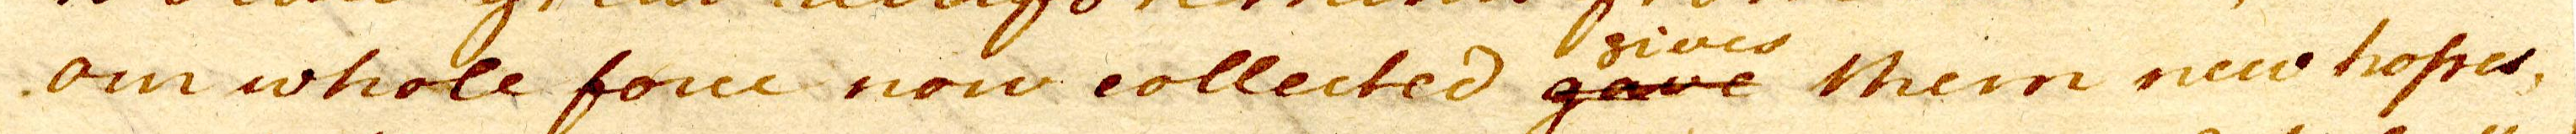our whole force now collected [gave] them new hopes,
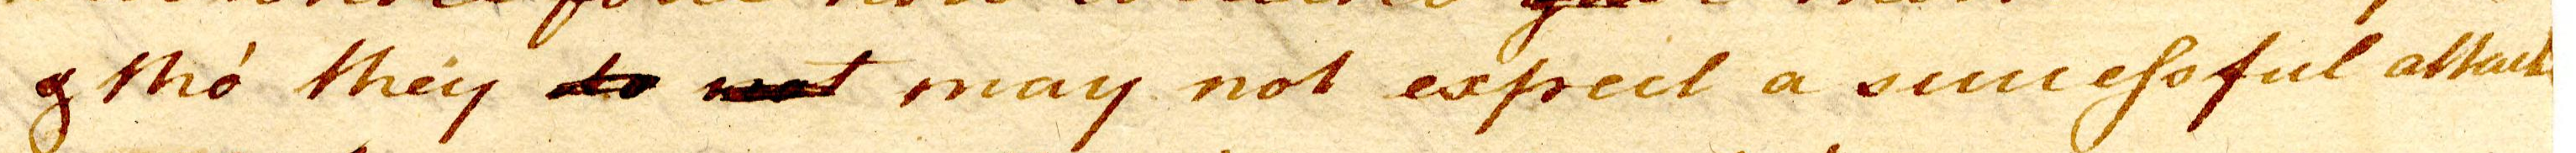& tho' they [do] [not] may not expect a successful attack
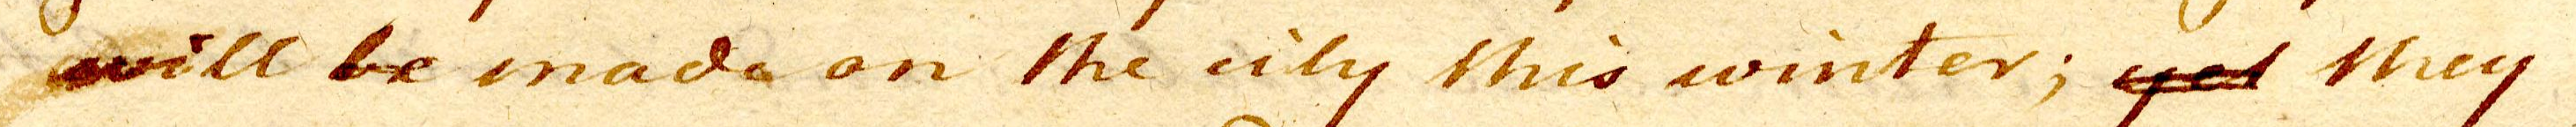will be made on the city this winter; [yet] they
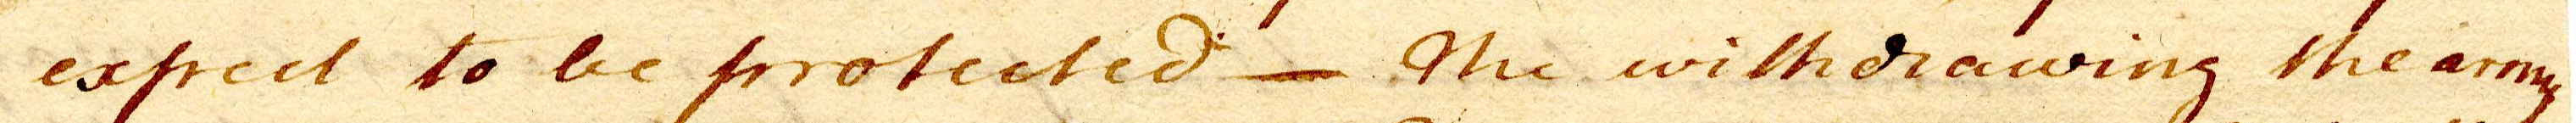expect to be protected- The withdrawing the army
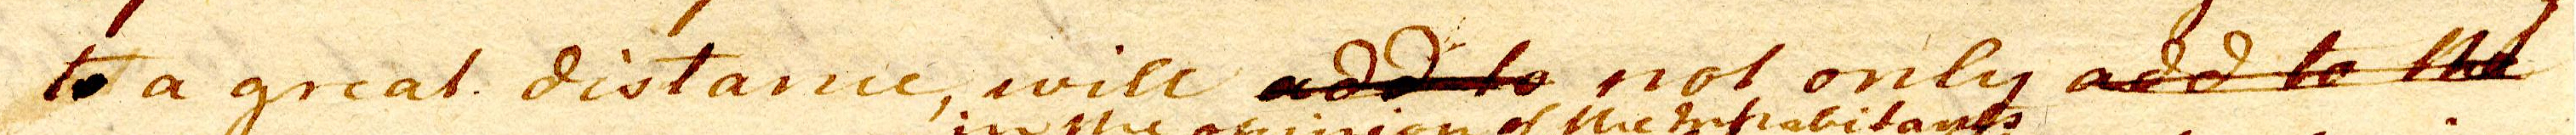to a great distance, will [add to] not only [add to the]
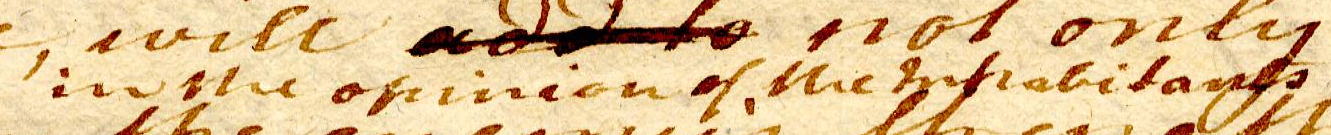in the opinion of the inhabitants
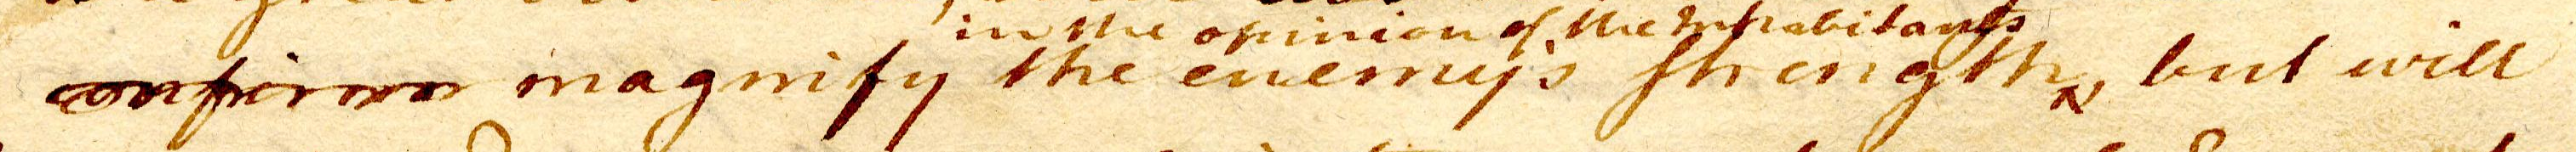[confirm] magnify the enemy's strength ^ but will
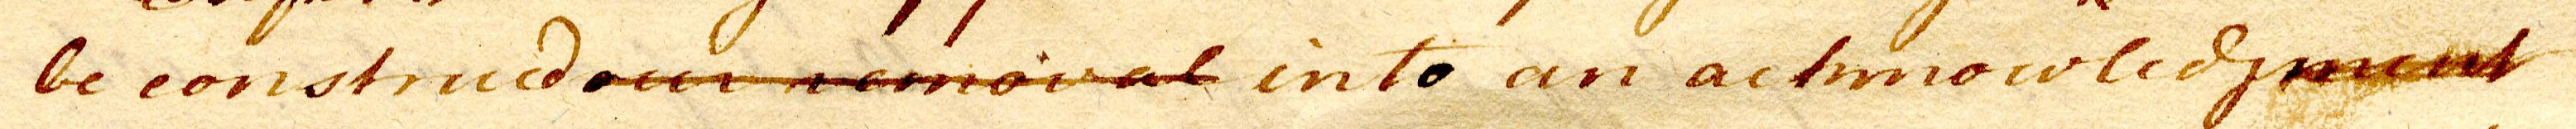be construed [our removal] into an aknowledgment
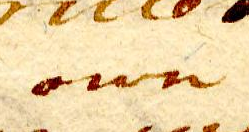own
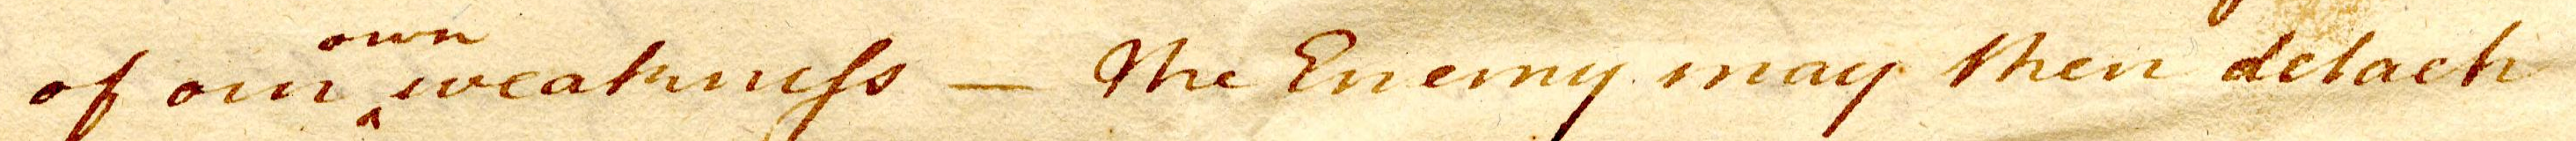of our ^ weakness - the Enemy may then detach
